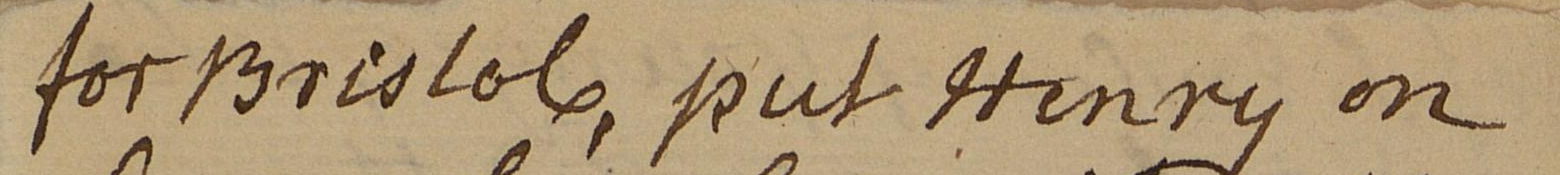for Bristol, put Henry on
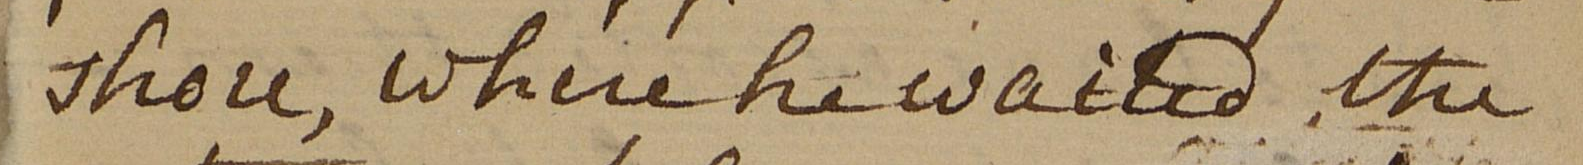shore, where he waited the
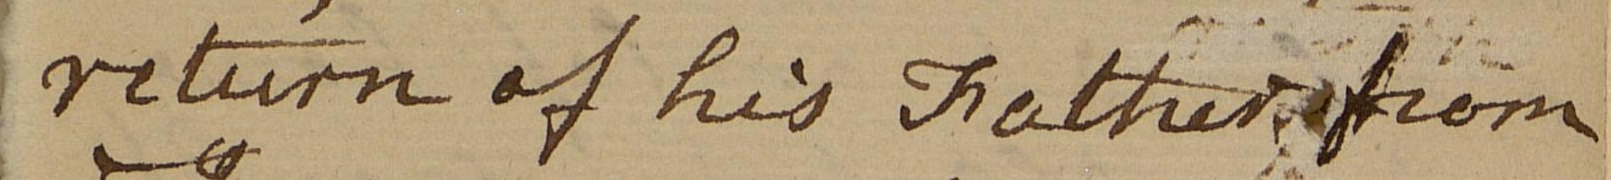return of his Father from
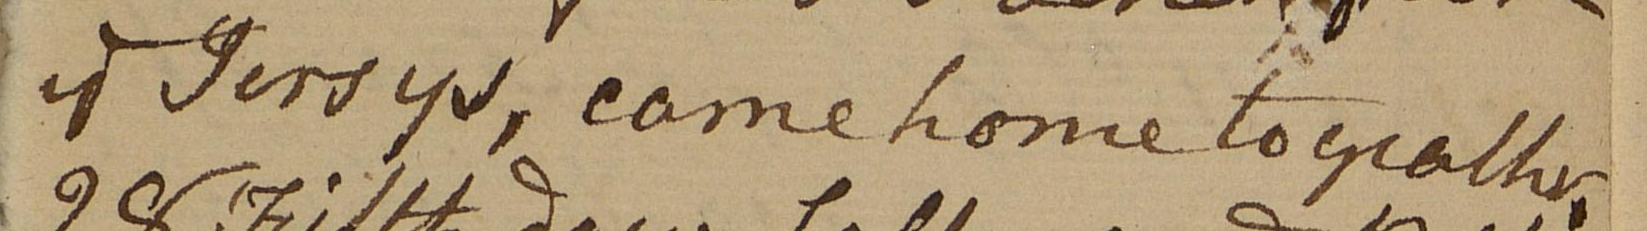y^e Jersys, came home togeather,
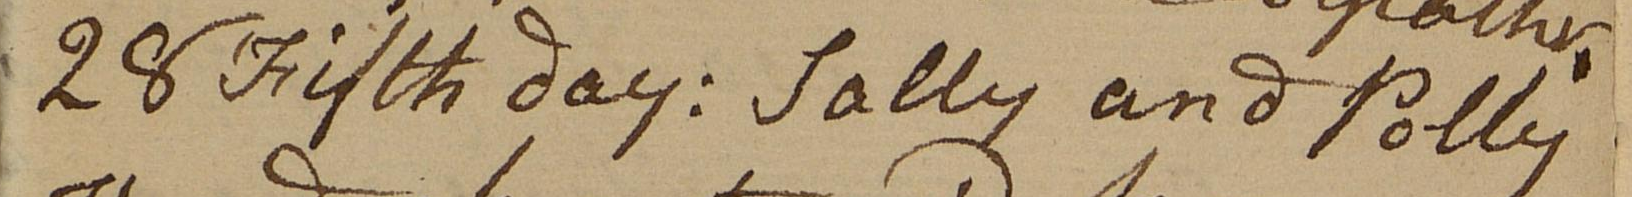28 Fifth day: Sally and Polly
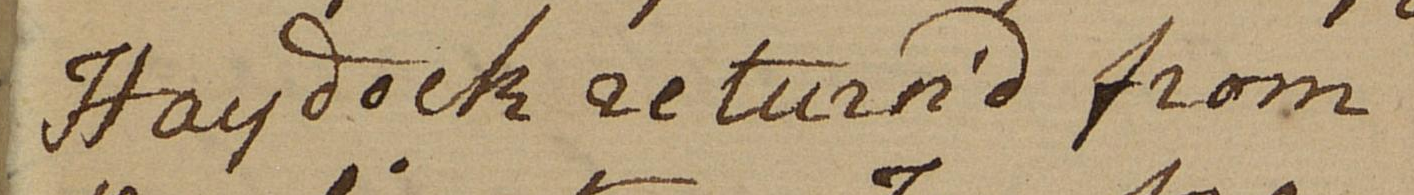Haydock returnr'd from
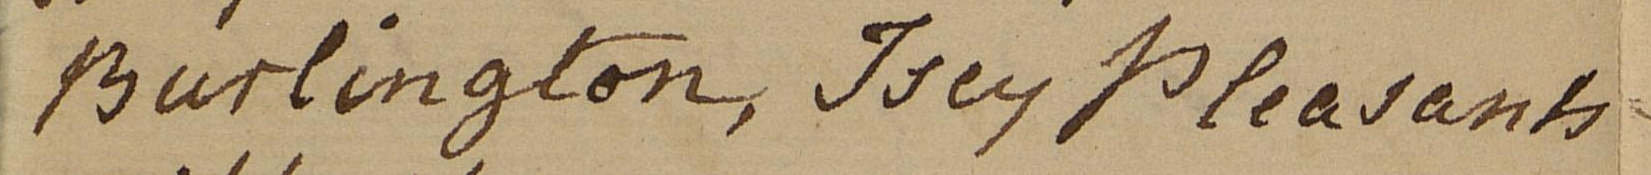Burlington, Isey Pleasants
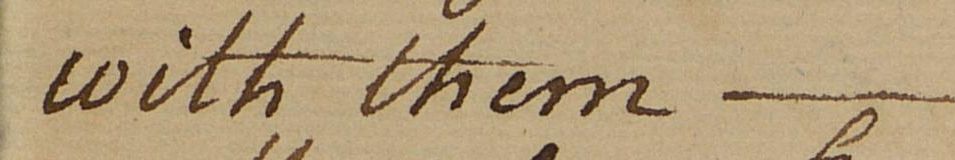with them-
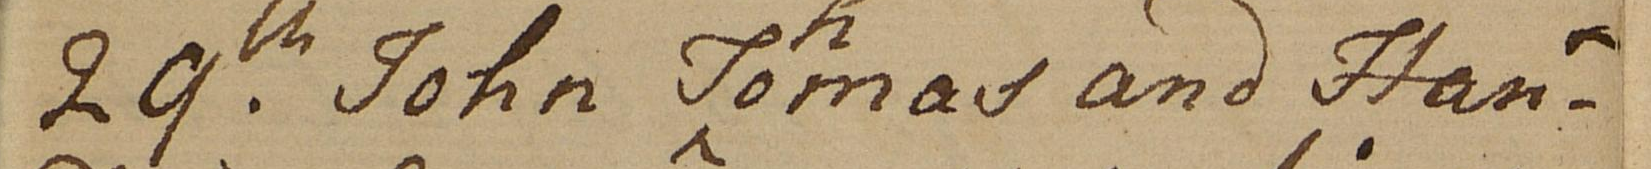29^th. John T ^ o ^h mas and Han^[h]-
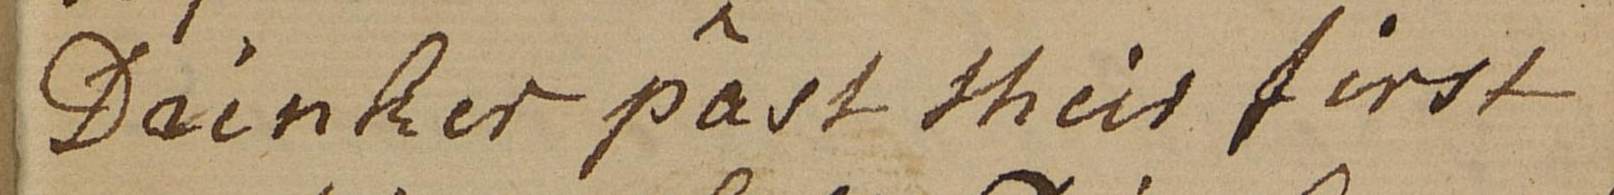Drinker past their first
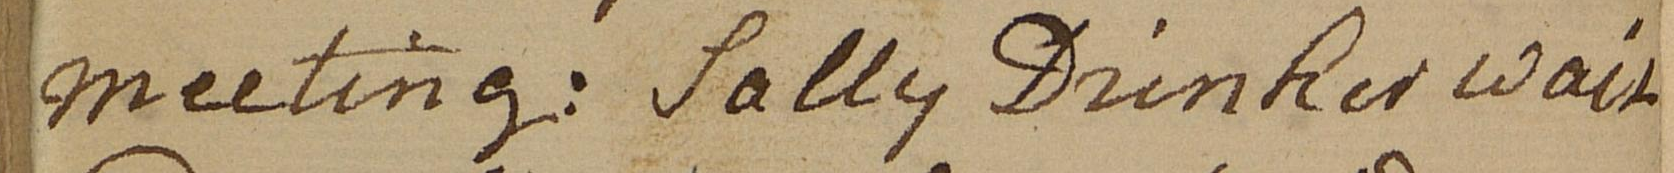meeting: Sally Drinker wait
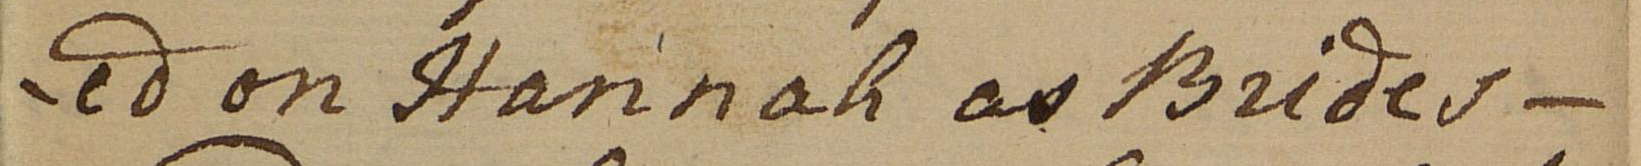-ed on Hannah as Brides-
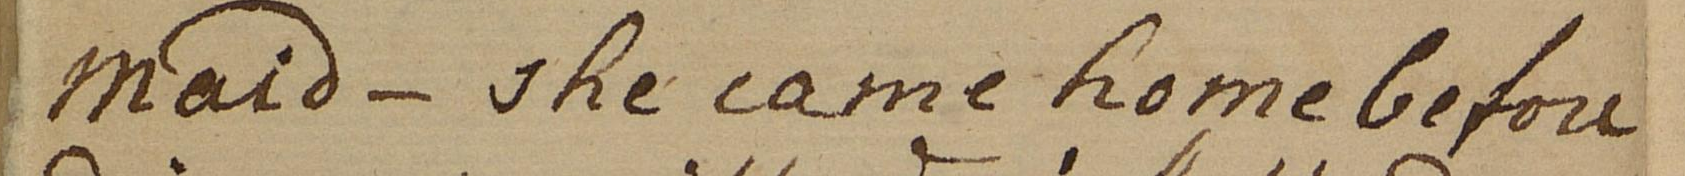maid- she came home before
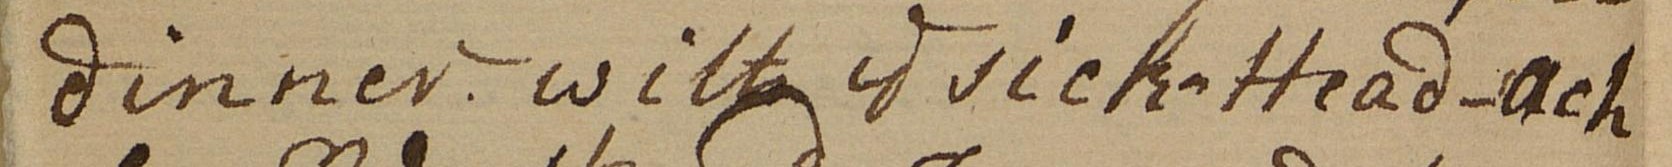dinner. with y^e sick-Head-ach
